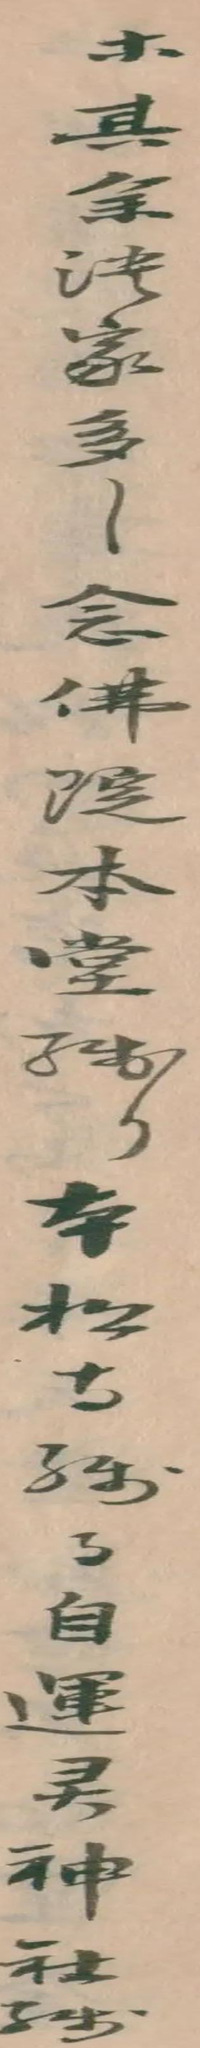等其余潰家多し念仏院本堂残り本松寺残る自運霊神社残
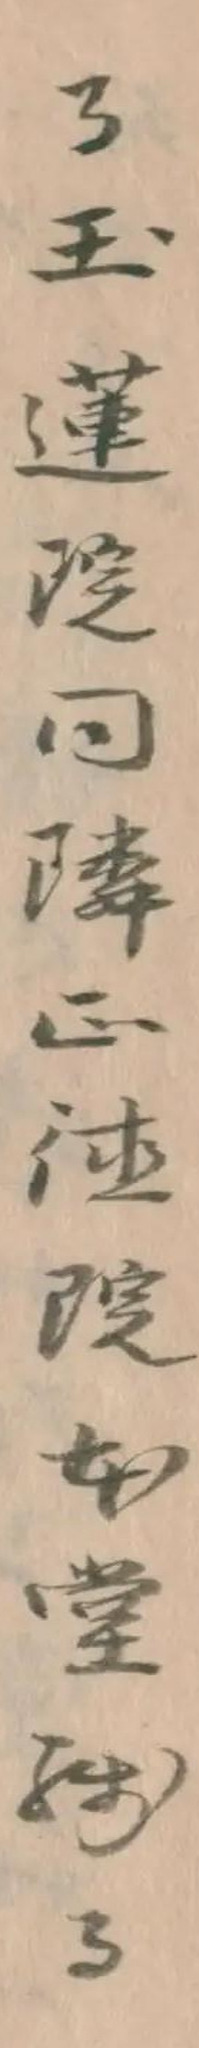る玉蓮院同隣正徳院本堂残る

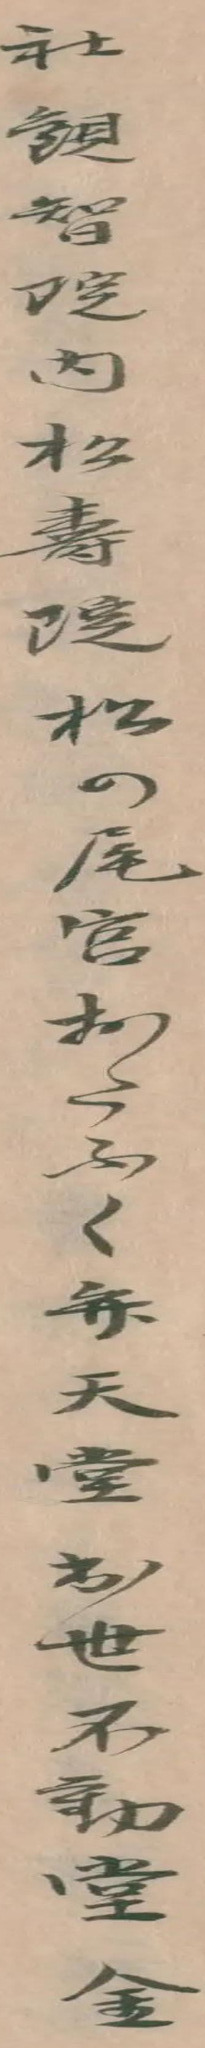社観智院内松寿院松の尾宮おたふく弁天堂出世不動堂金
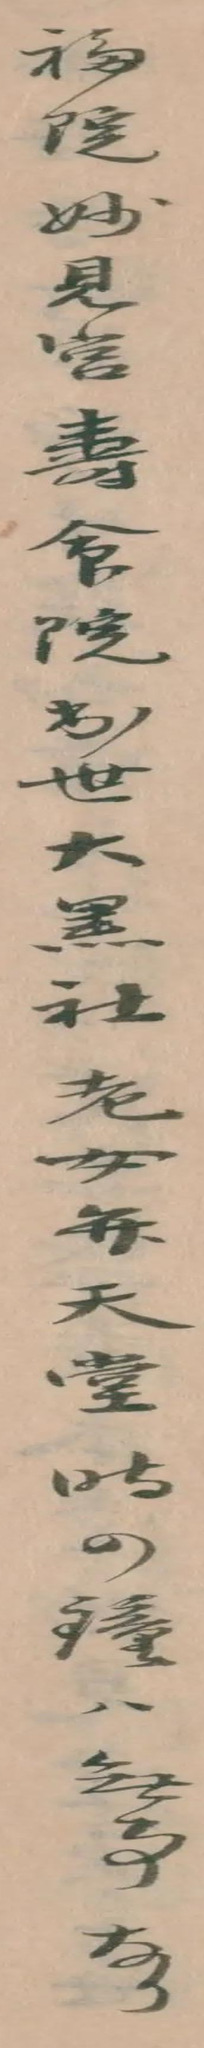福院妙見宮寿命院出世大黒社老女弁天堂時の鐘は無事なり
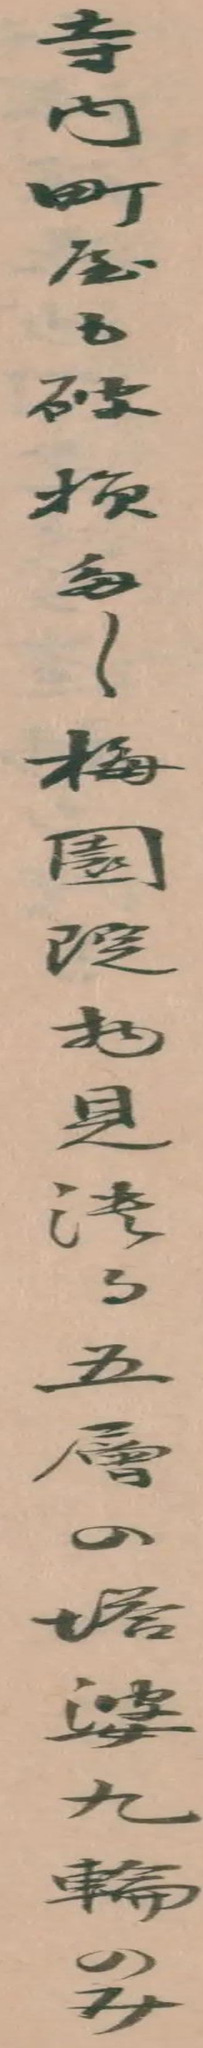寺門町屋も破損多し梅園院物見潰る五層の塔婆九輪のみ
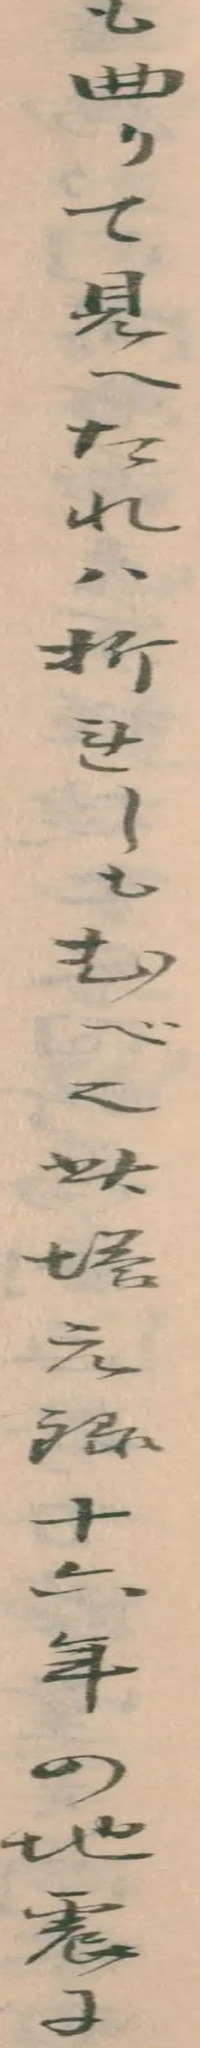も曲りて見へたれは折れしもむべ也此塔元禄十六年の地震に
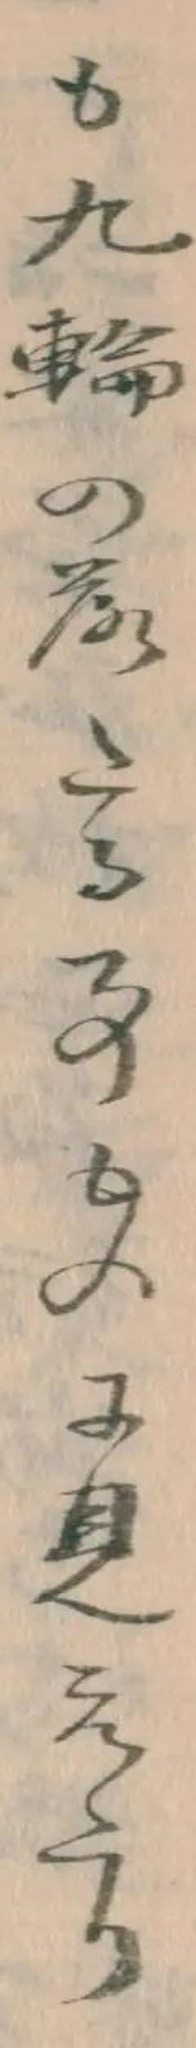も九輪の落たる事ものに見えたり
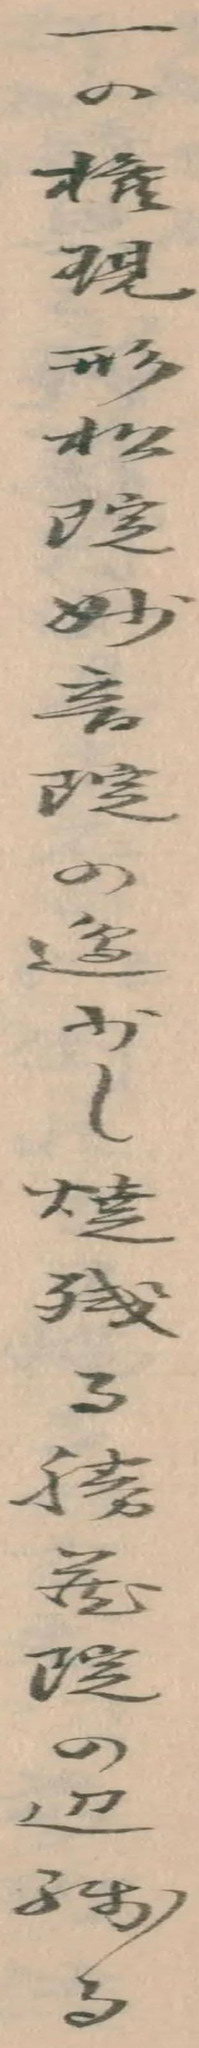一の権現形松院妙音院の辺少し焼残る勝蔵院の辺残る
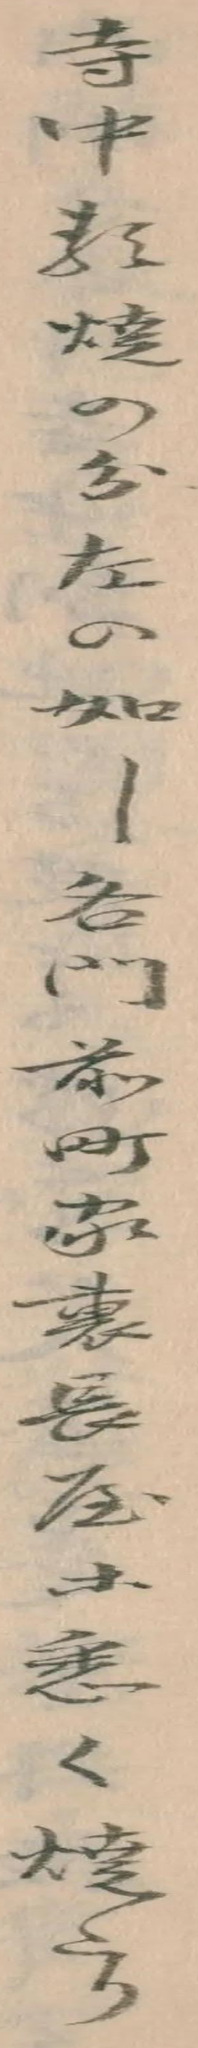寺中類焼の分左の如し各門前町家裏長屋等悉く焼たり
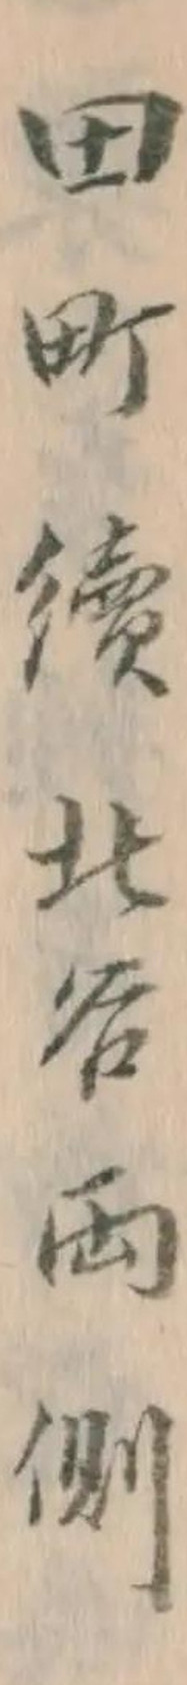田町続北谷両側
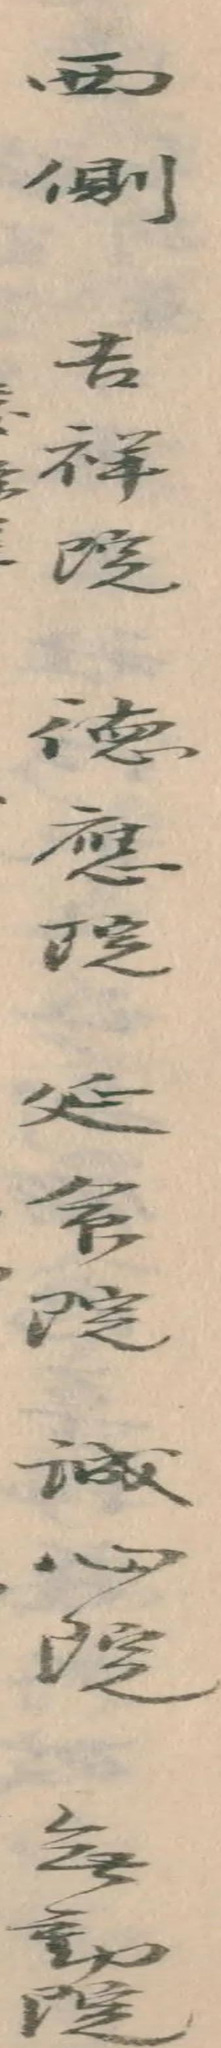西側吉祥院徳応院延命院誠心院無動院
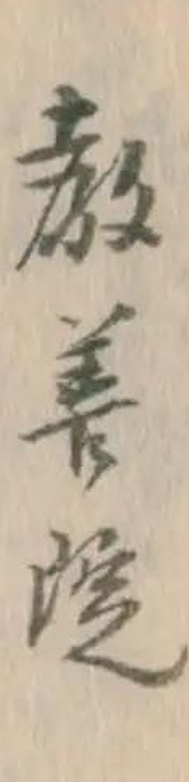教善院
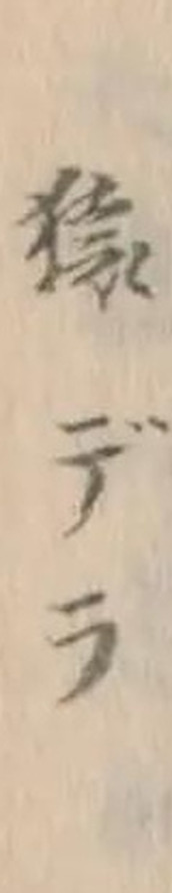猿デラ
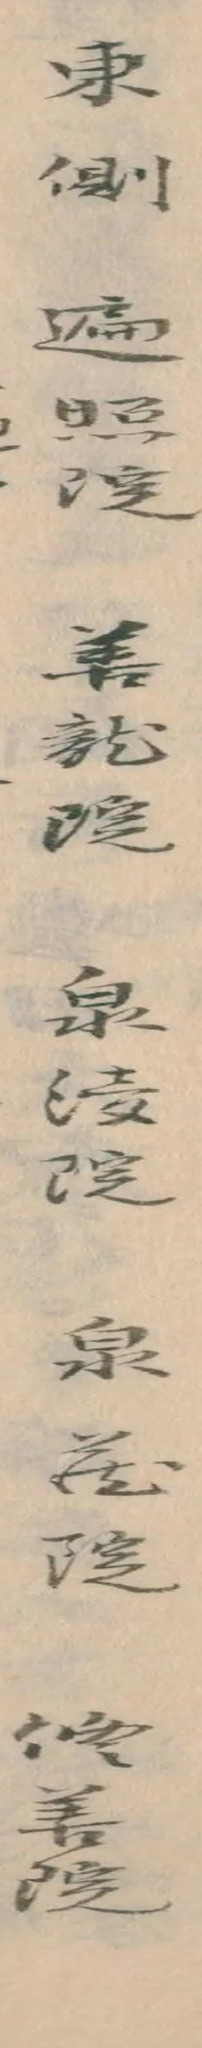東側遍照院善龍院泉陵院泉蔵院修善院
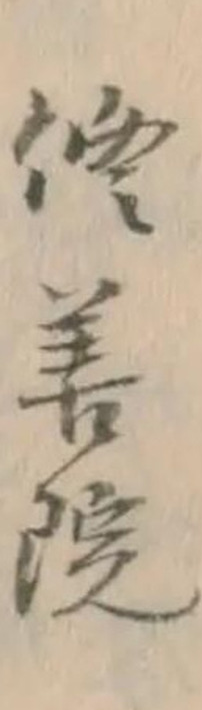教善院
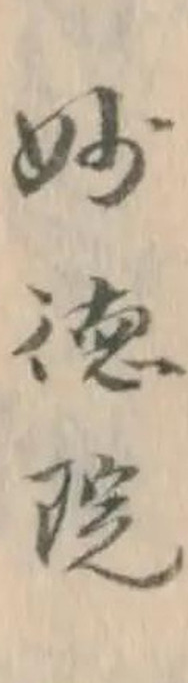妙徳院
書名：地災撮要. 巻7-9(地震之部)
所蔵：国立国会図書館 National Diet Library, JAPAN
